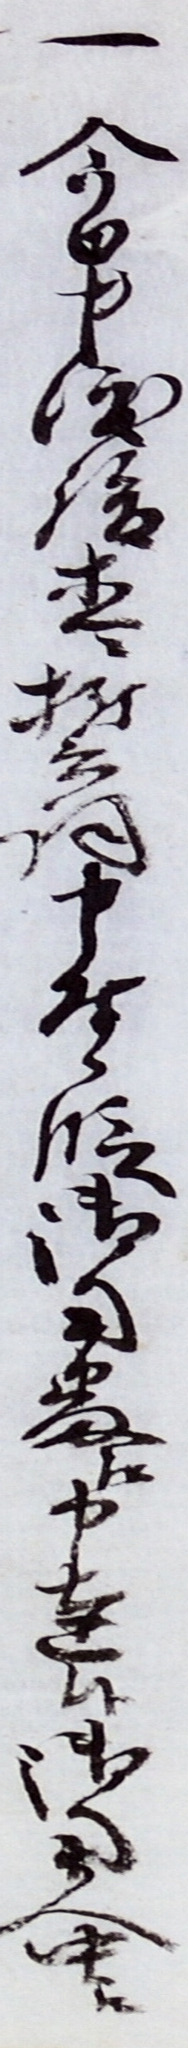一今日申渡後直ニ折兵衛申付候段御用番江申達候御用人中江
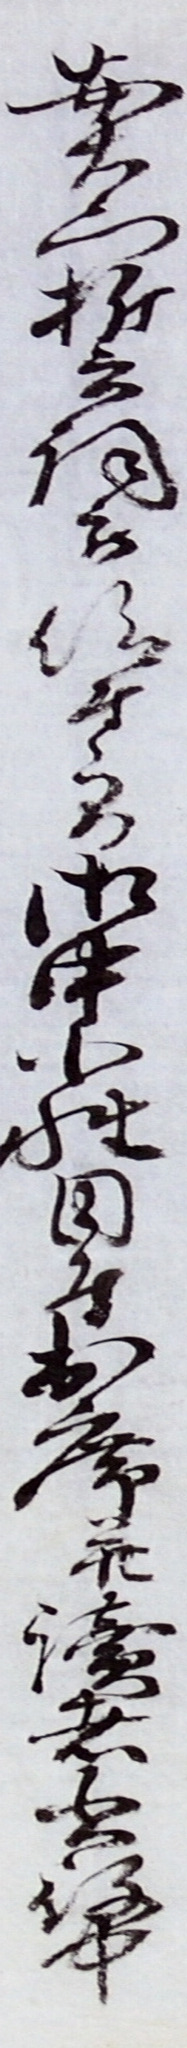一安右衛門牧太伺被仰付候間御中小姓目付出席并読者出役中
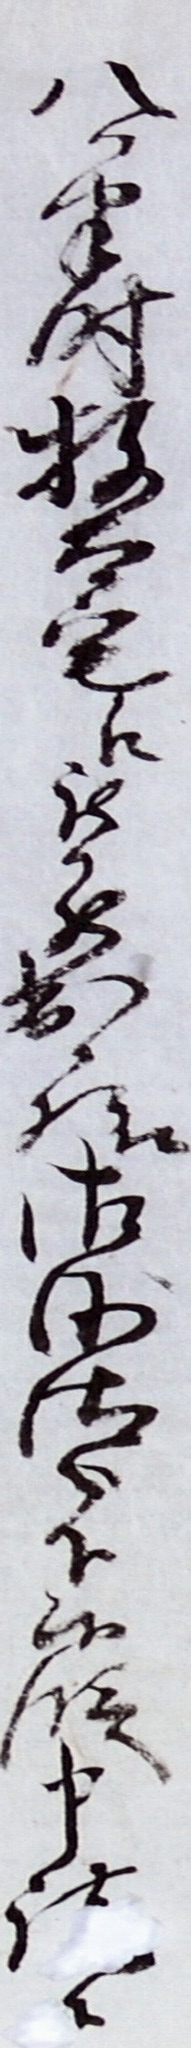八ツ半時牧太宅江被罷出候様御沙汰被下候段申請候
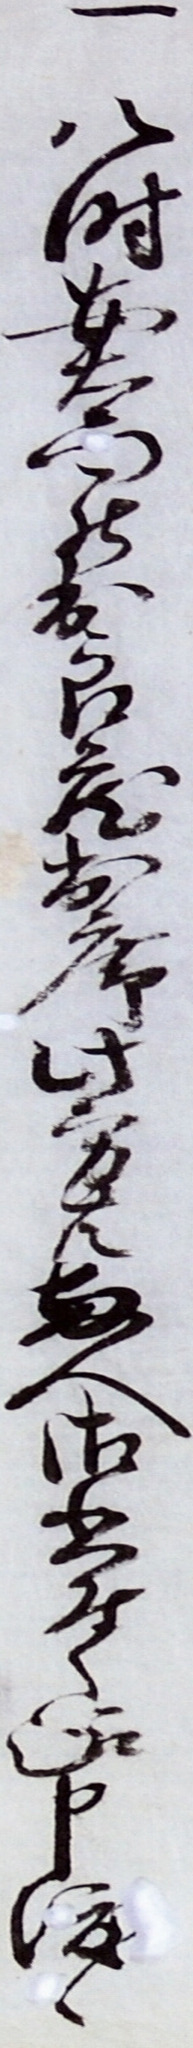一八時安右衛門罷出良蔵出席此方共両人御書付之趣申渡候
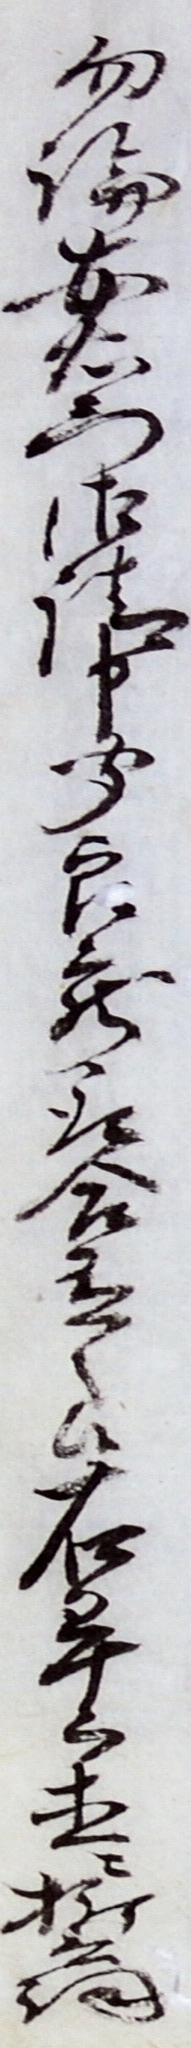勿論安右衛門御請申聞良蔵取合有之候右之年而直ニ折書伺

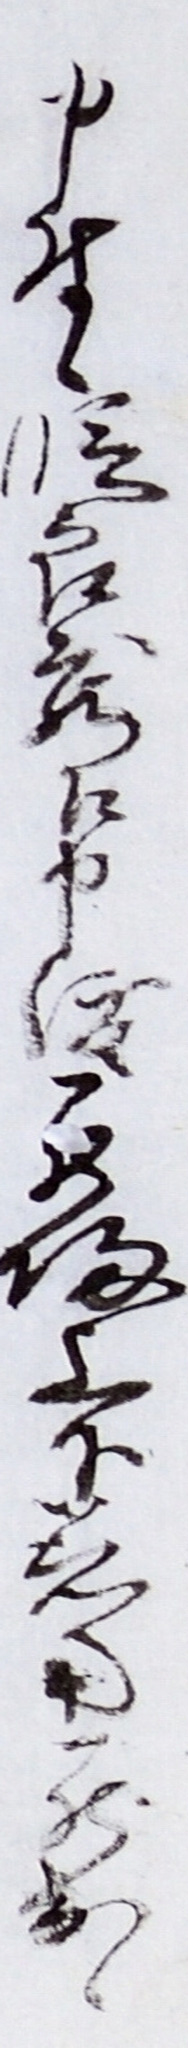申付候段良蔵江申渡被帰上下着用罷出候
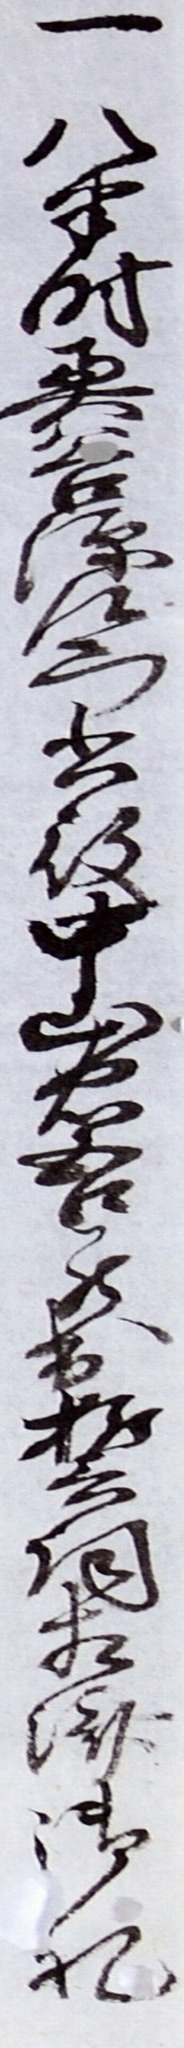一八半時奥谷源左衛門書役中山忠右衛門罷出誓詞相済御礼
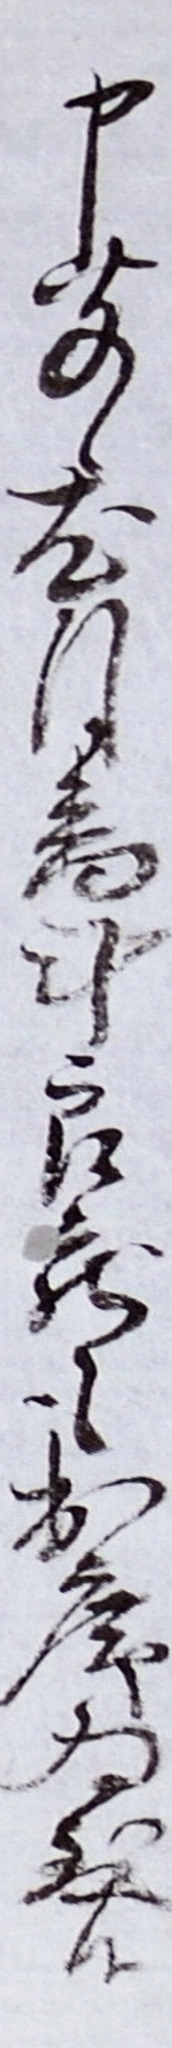申聞候尤月番計良蔵も出席為致候
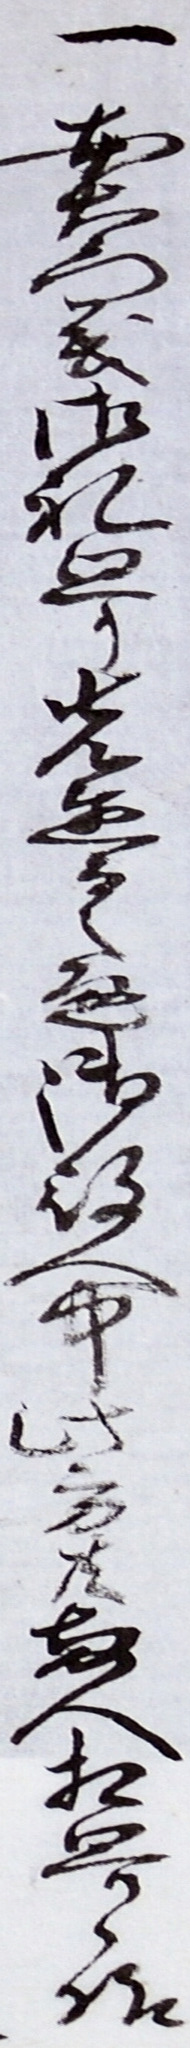一安右衛門義御礼廻り先達而之通御役人中此方共両人相廻り候様
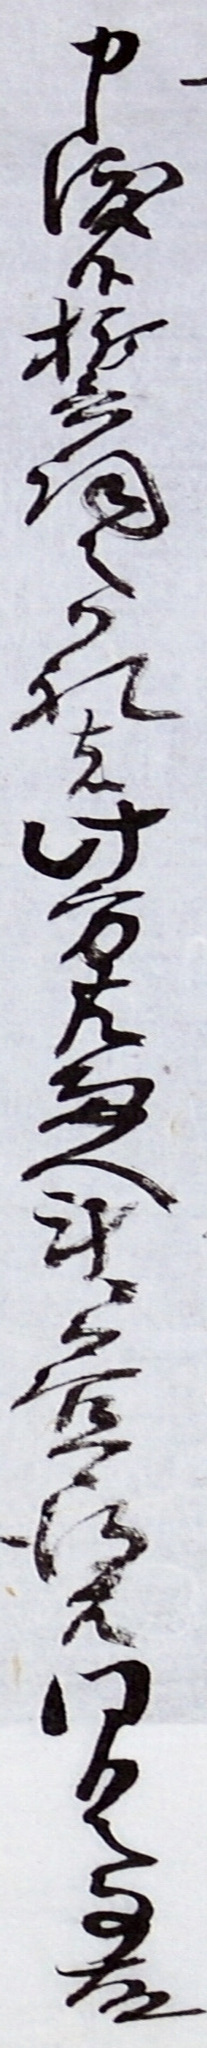申渡候誓詞之御札は此方共両人計ニ而宜候得共同日之事故
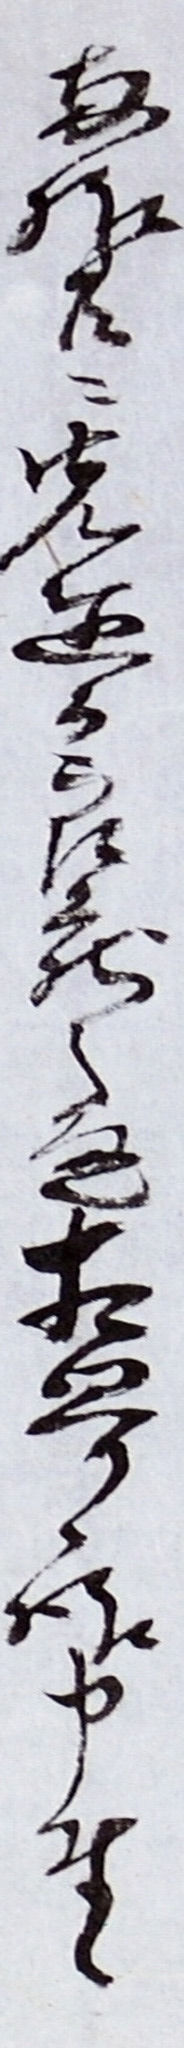両様共ニ先達而良蔵之通相廻り候様申付候
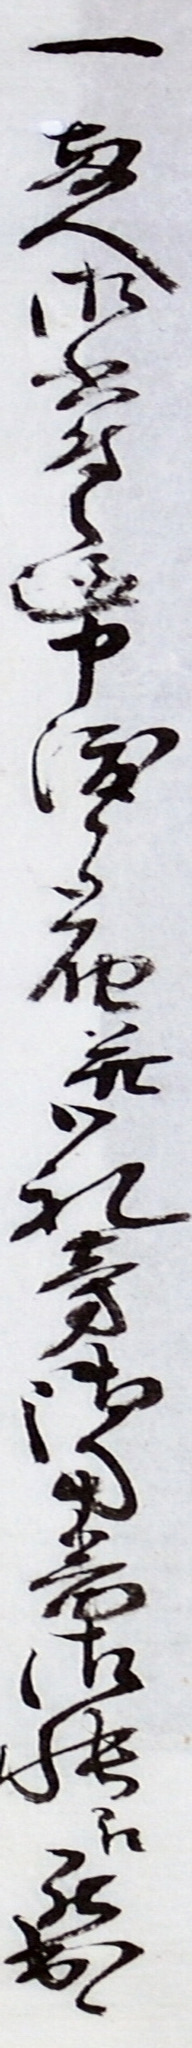一両人御書付之趣申渡し候御届并御礼旁御用番御江罷出候
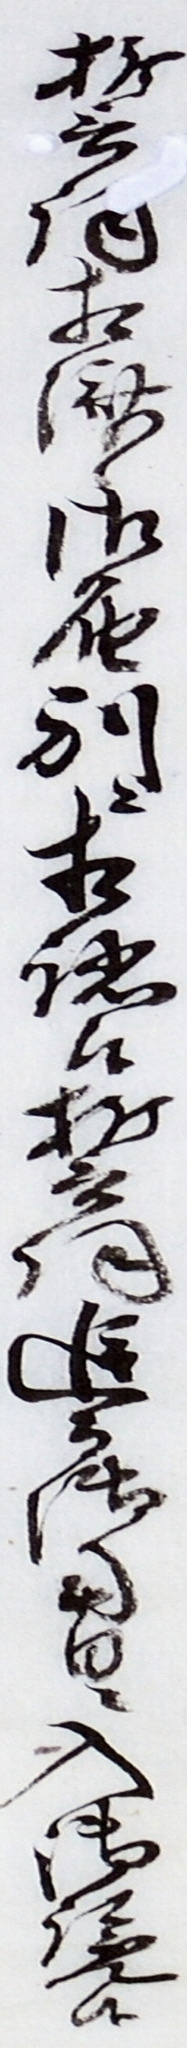誓詞相済候御届別ニ相認候誓詞追而御用日ニ入御覧候
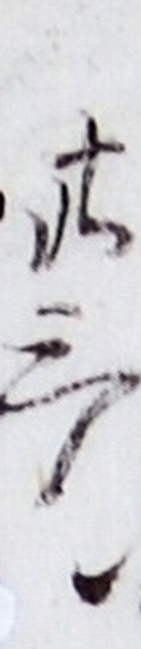廿三日
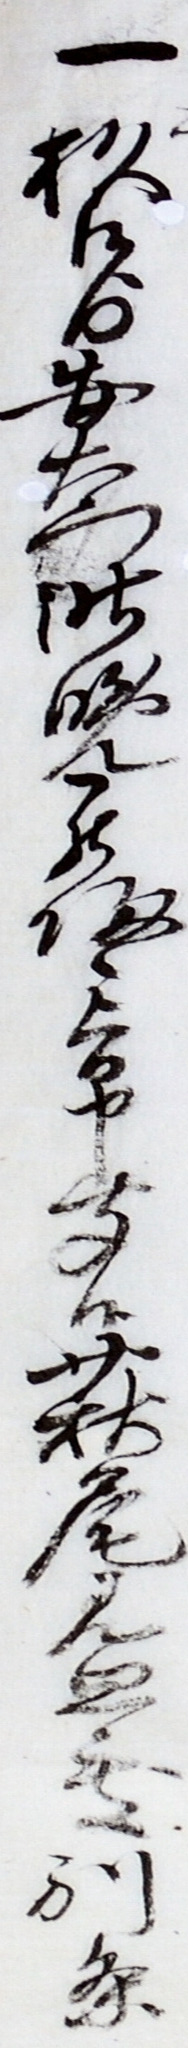一杉左衛門安右衛門昨晩罷帰候旨申聞候萩尾見廻処別条
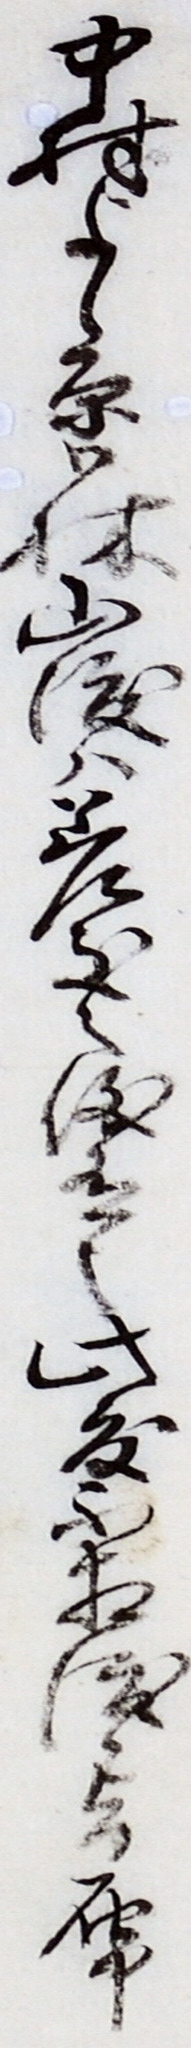一中村よし原御林山渡ハ差支之儀有之此度不相渡候旨届申
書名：御山奉行御用控
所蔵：伊那市立高遠町図書館・合同会社AMANE
